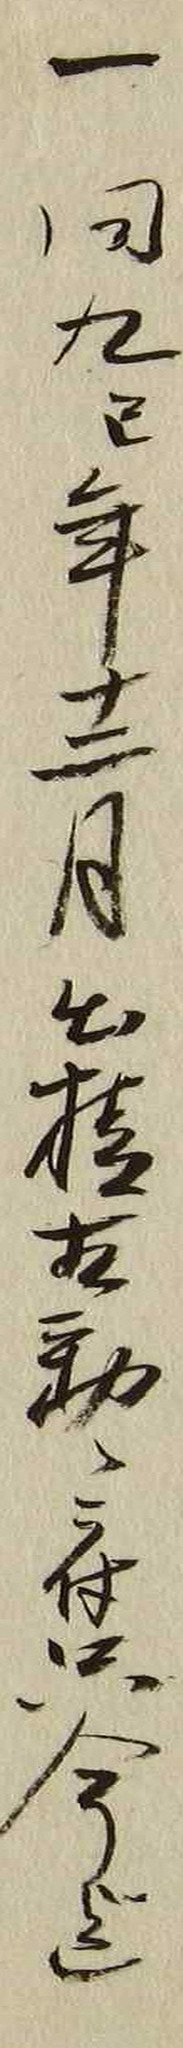一同九巳年十二月出精相勤候ニ付只今迄
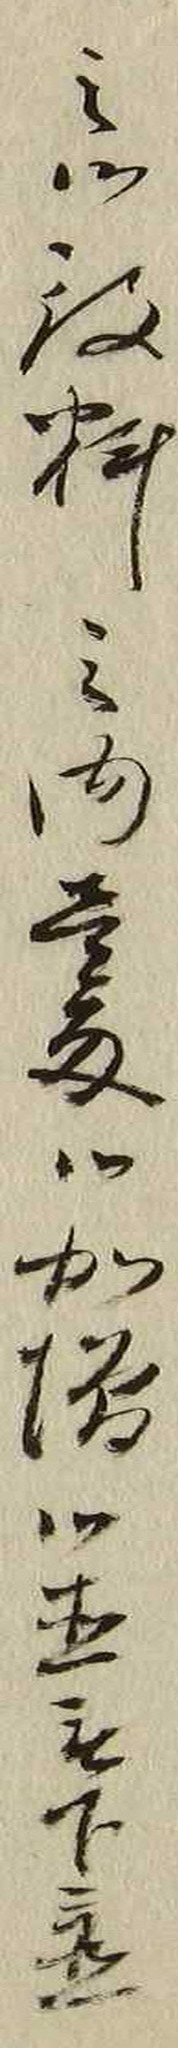之御役料之内壱両御加増御直被下置
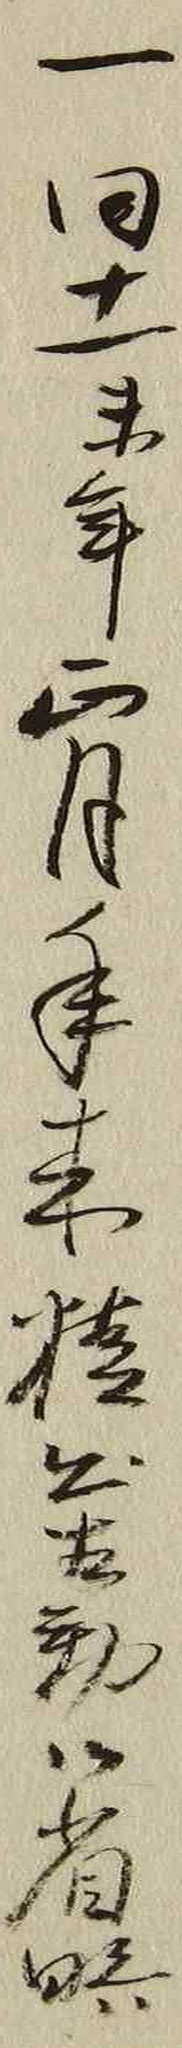一同十一未年正月年来精出相勤御省略
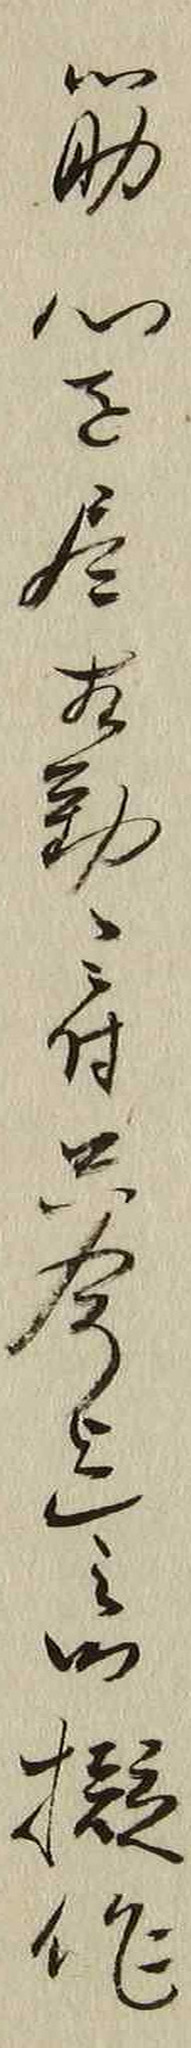筋心を尽相勤候ニ付只今迄之御擬作
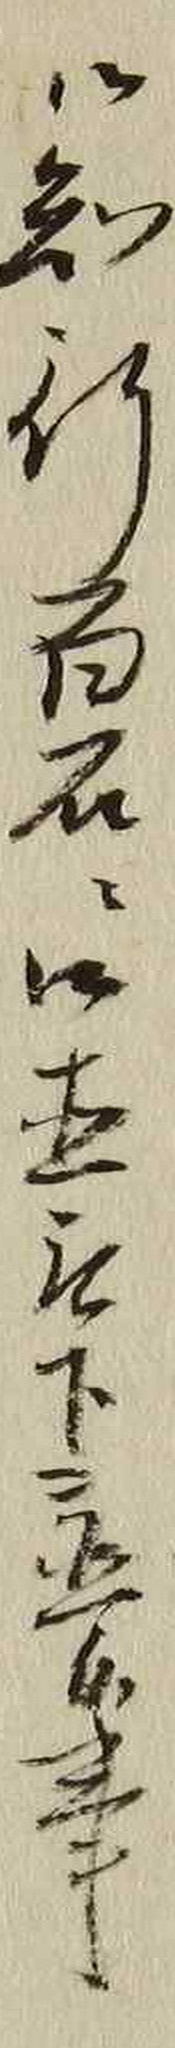御知行百石ニ御直被下置候事
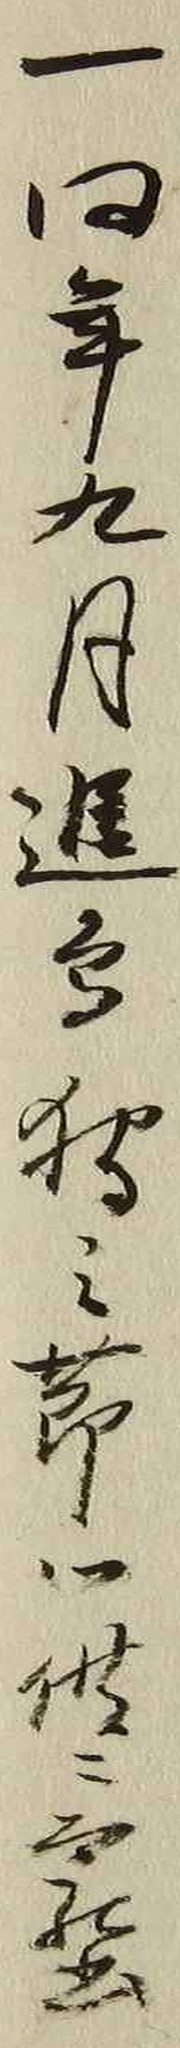一同年九月追鳥狩之節御供ニ而罷出
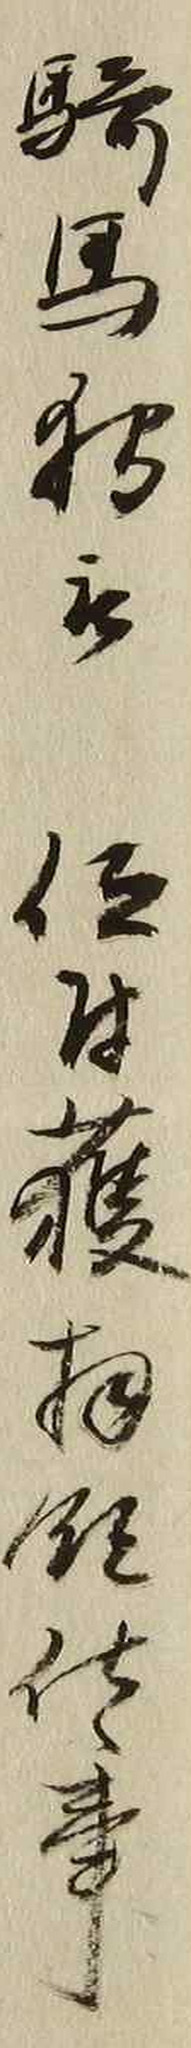騎馬狩被仰付獲拝領仕候事
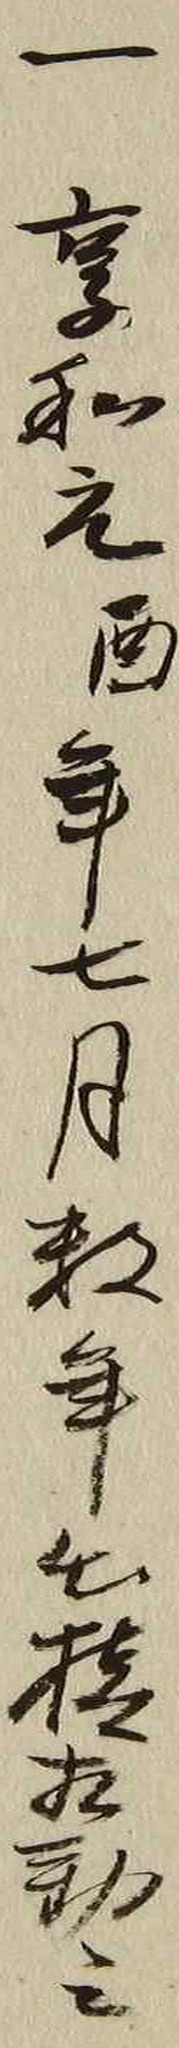一享和元酉年七月数年出精相勤候ニ
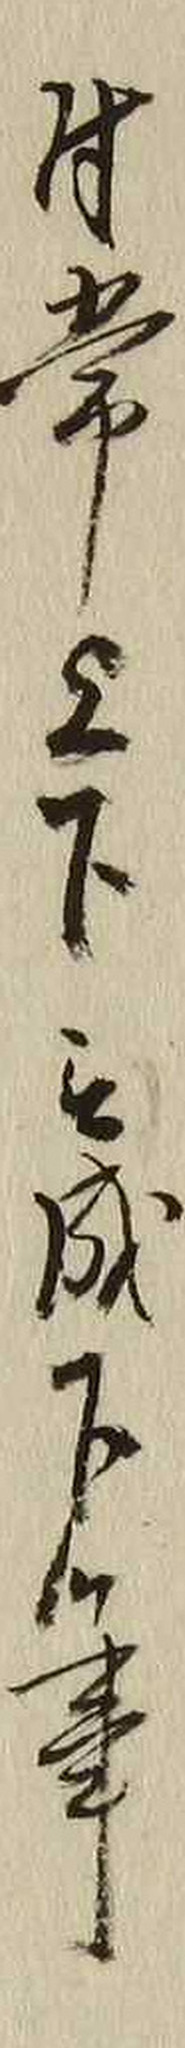付常上下被成下候事
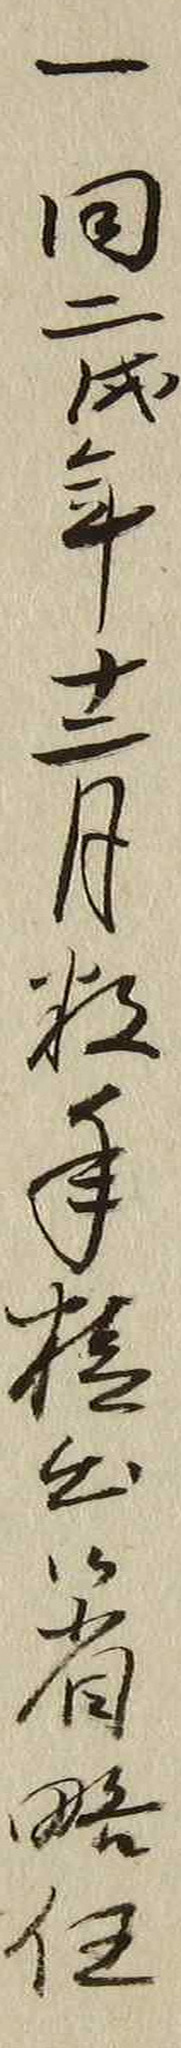一同二戌年十二月数年精出御省略任
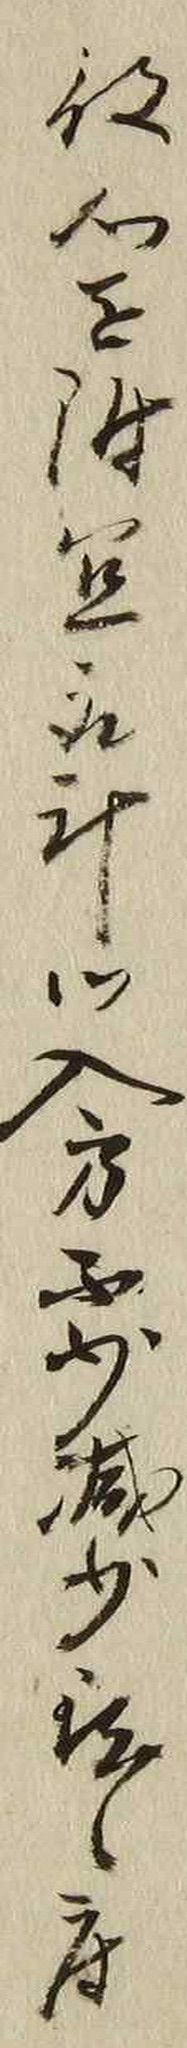役心を附宜取計御入方不少減少致候ニ付
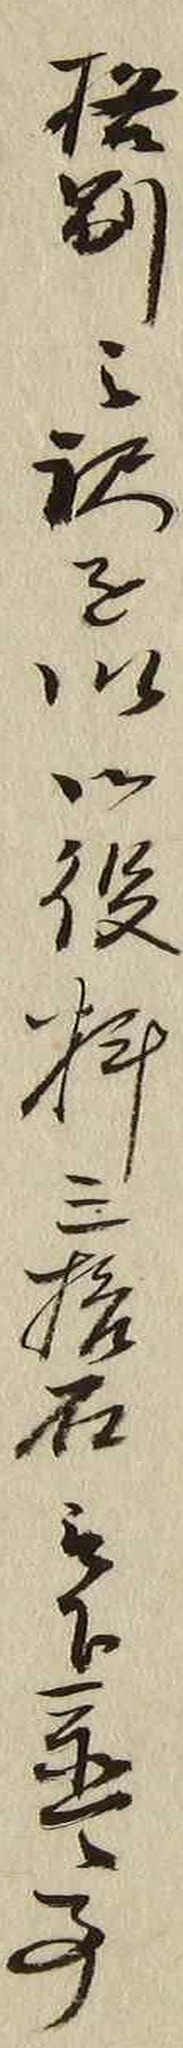格別之訳を以御役料三拾石被下置候事
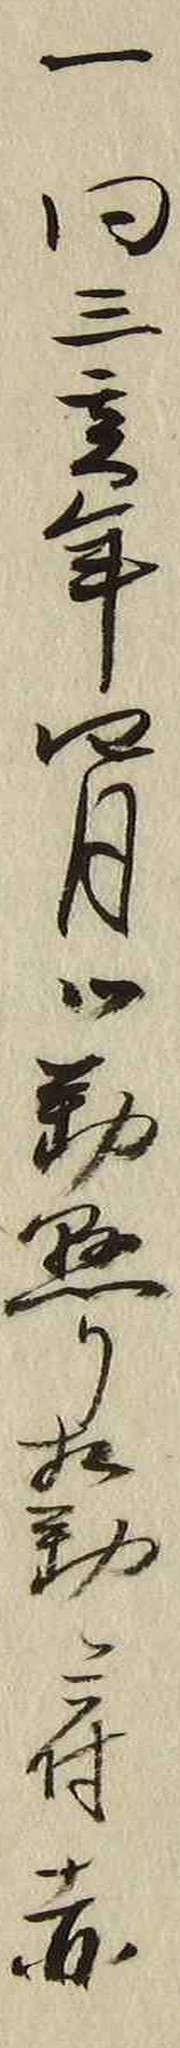一同三亥年四月御勤懸り相勤候ニ付赤
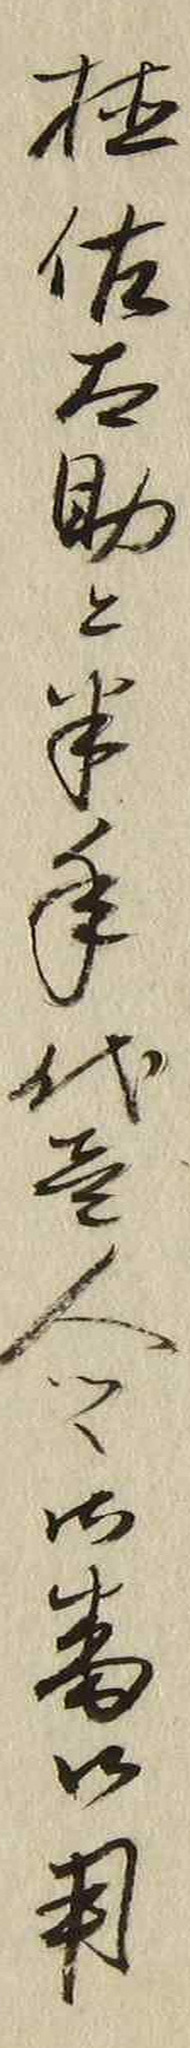植佐太助と半年代壱人ツヽ御番御用
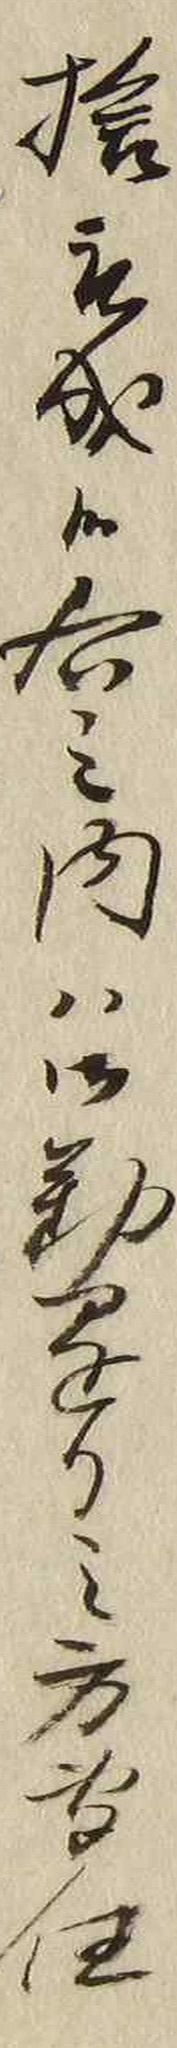捨被成候右之内ハ御勤懸り之方専任
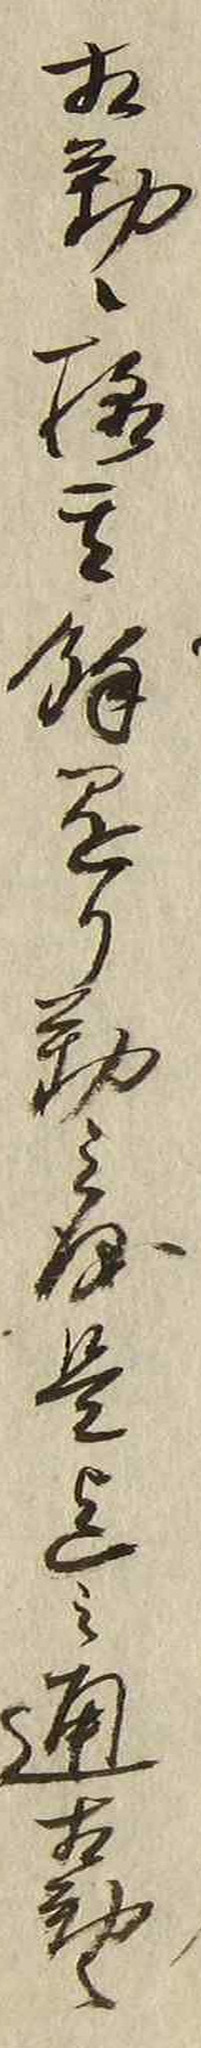相勤候様其余懸り勤之儀是迄之通相勤候
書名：諸士系譜　巻之345　も之部1
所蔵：会津若松市立会津図書館
